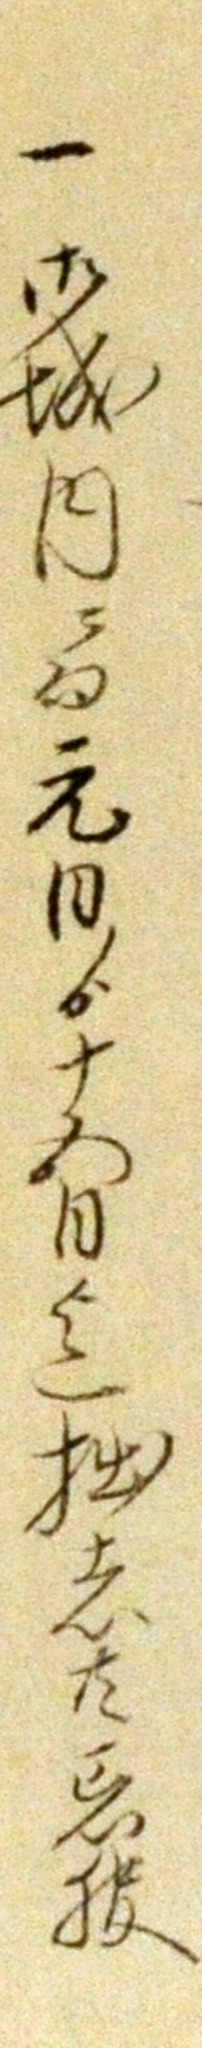一御城内ニ而元日ゟ十五日迄拙者共着服
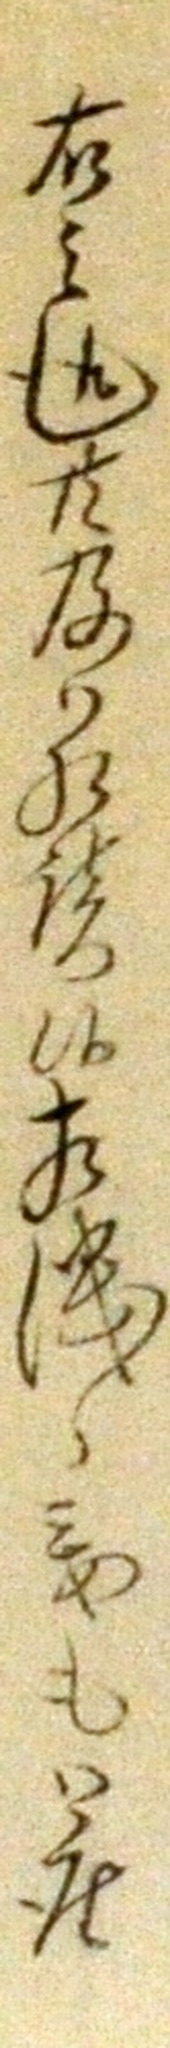右之趣共及御相談候相洩候義も御座
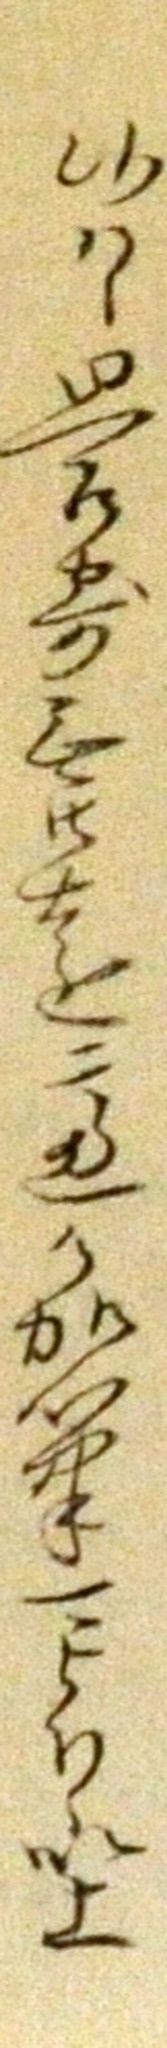候ハヽ思召寄無御遠慮御加筆可被下候以上
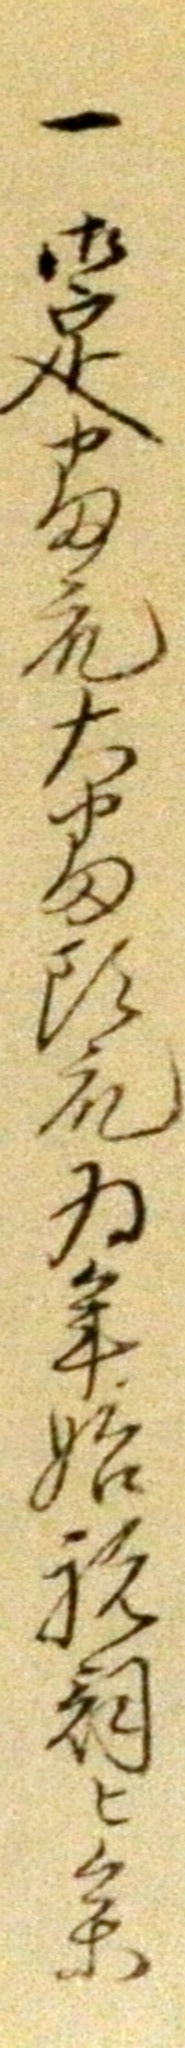一御定番衆大番頭衆為年始祝詞被参
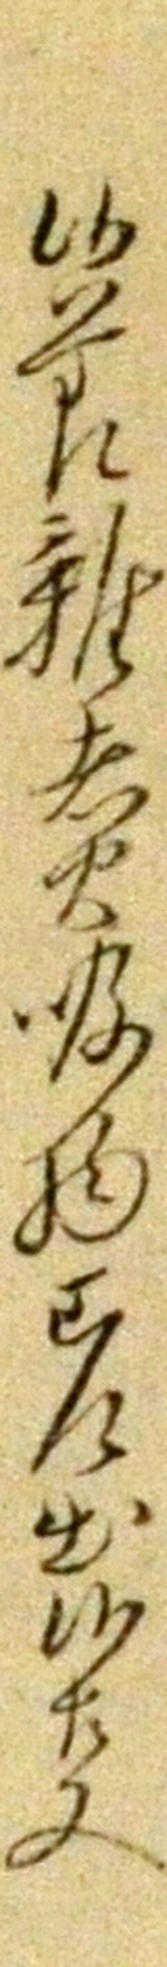候節雑煮吸物差出候事
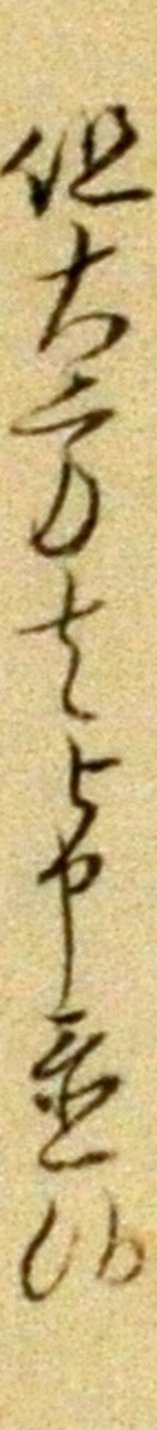但大方は被申置候
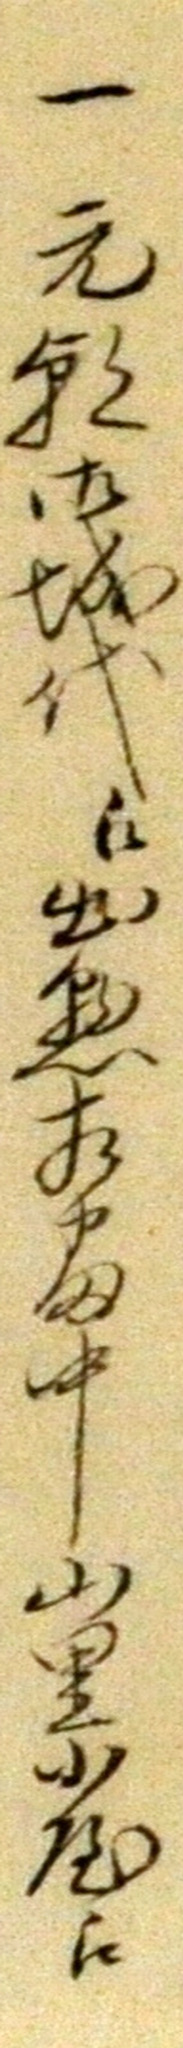一元朝御城代え出懸相番中山里小屋え
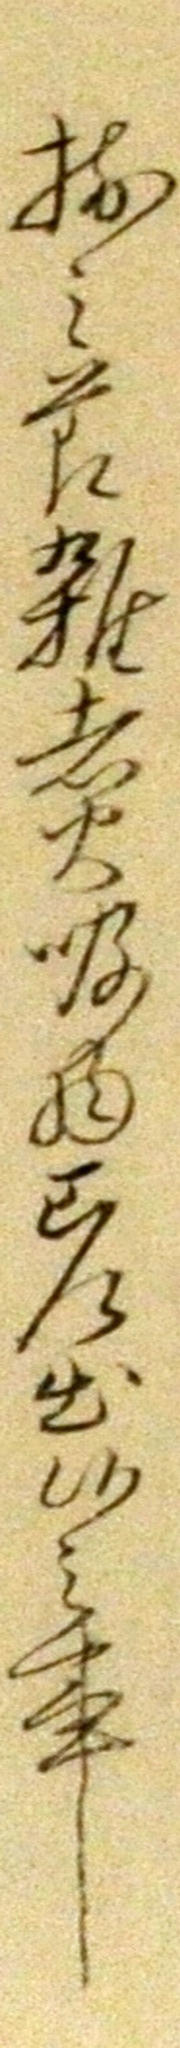揃之節雑煮吸物差出候之事
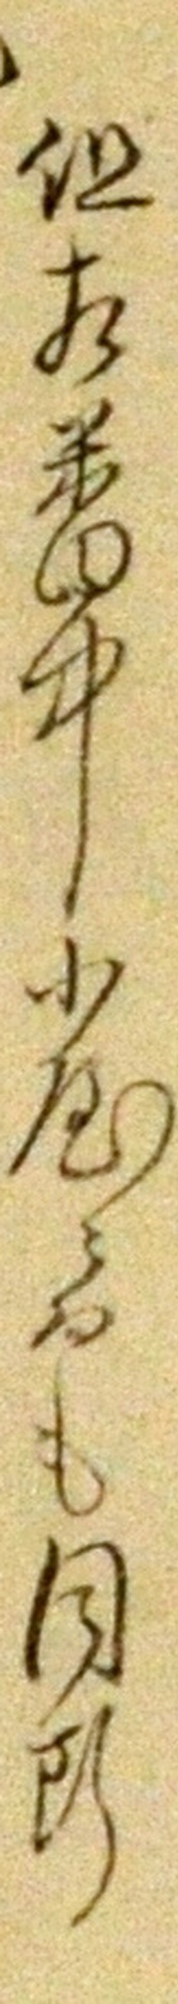但相番中小屋ニ而も同断
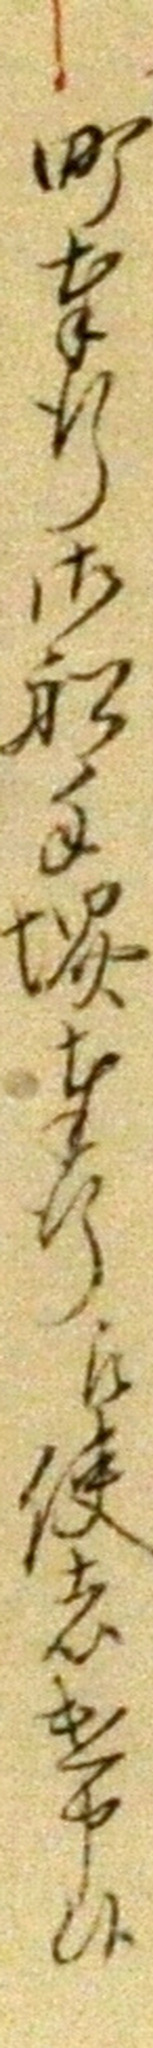町奉行所御船手堺奉行え使者遣申候

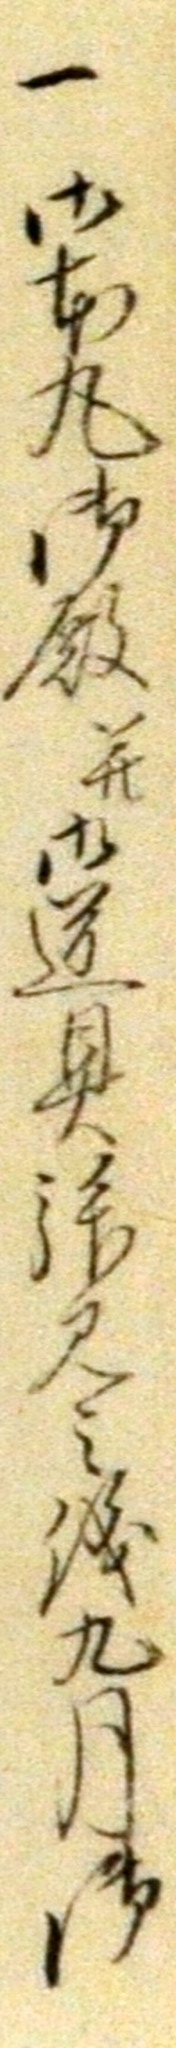一御本丸御殿并御道具拝見之儀九月御
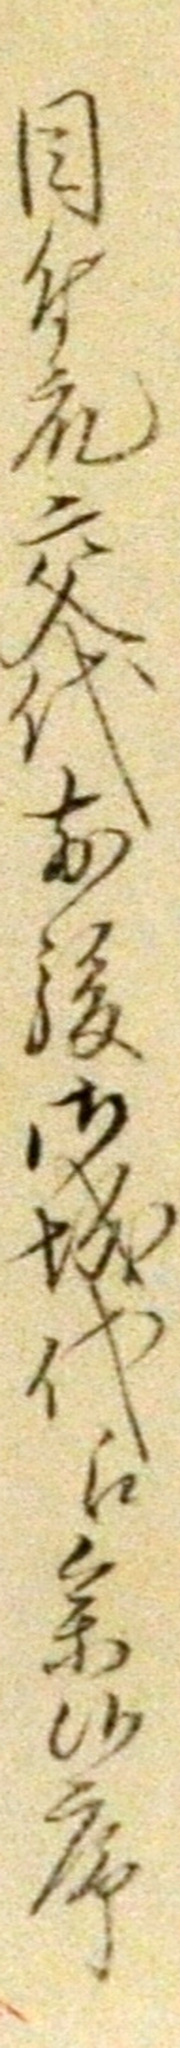目付衆交代前後御城代え参候席
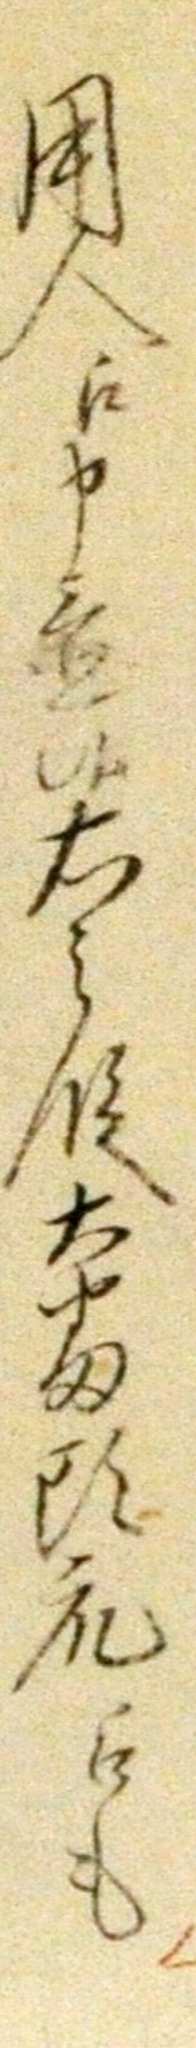用人え申置候右之段大番頭衆えも
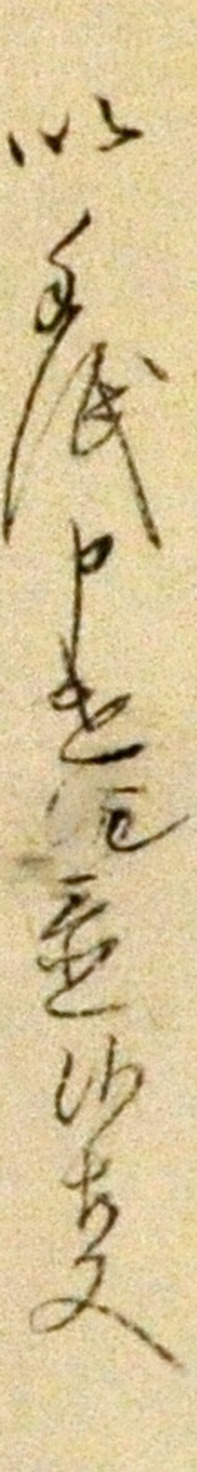以手紙申遣被置候事
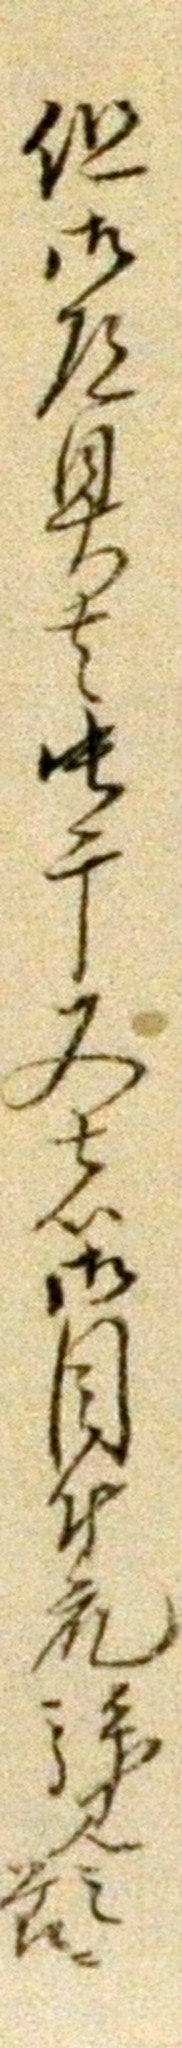但御道具は虫干又は御目付衆拝見之節ニ
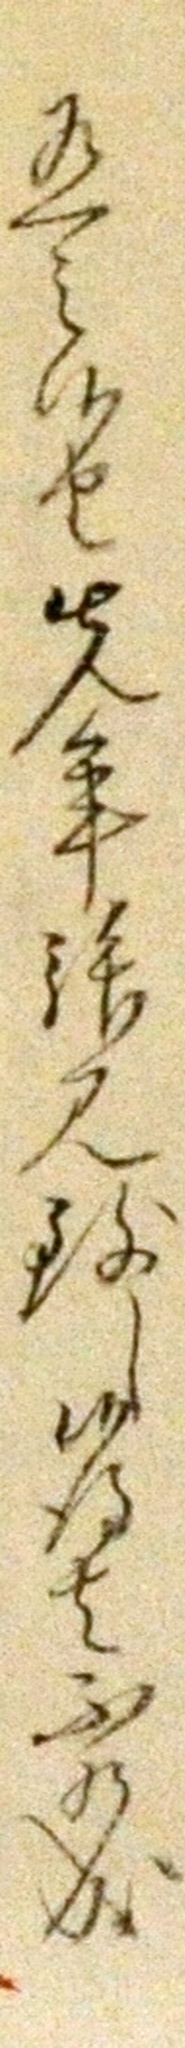有之候由先年拝見致し候得は不相成
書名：大阪加番関係諸書留〔一括〕
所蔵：伊那市立高遠町図書館・合同会社AMANE
